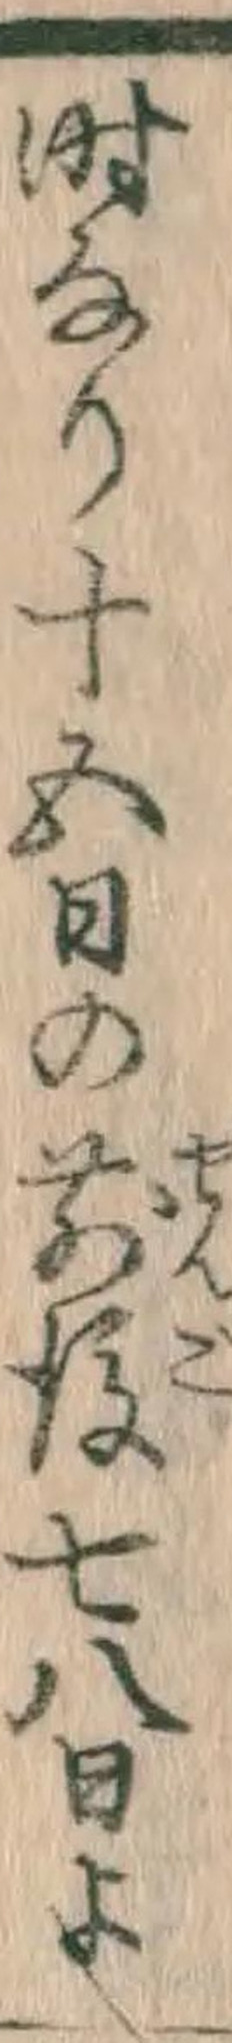時なり十五日の前後七八日よ
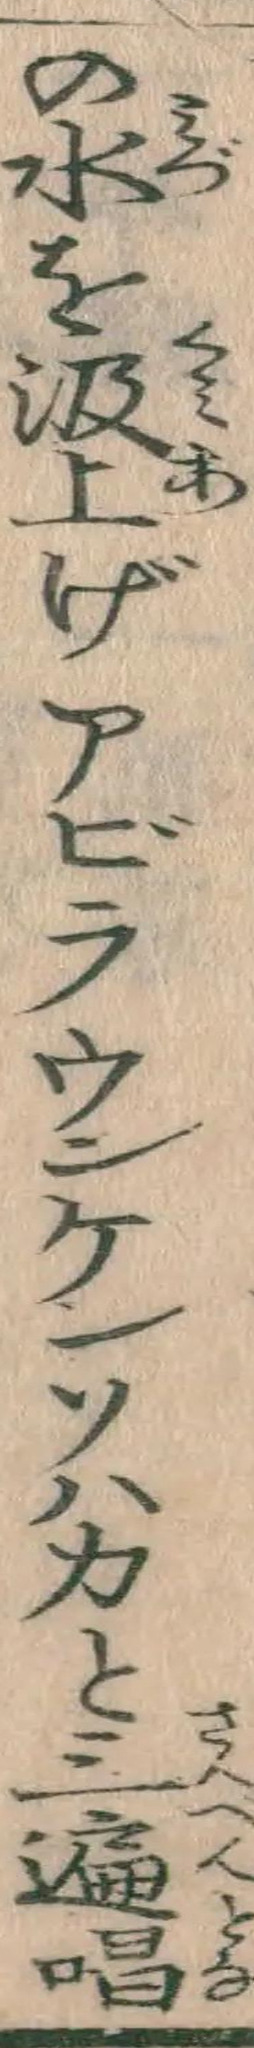の水を汲上げアビラウンケンソハカと三遍唱
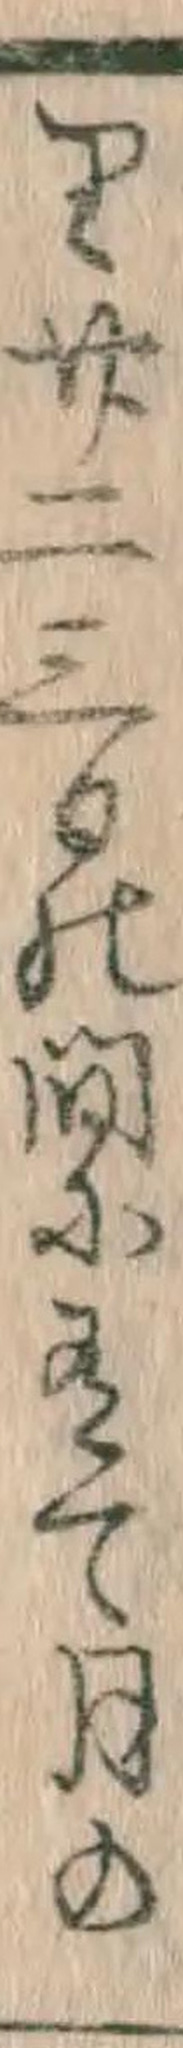り廿ニ三日の間に有て月の
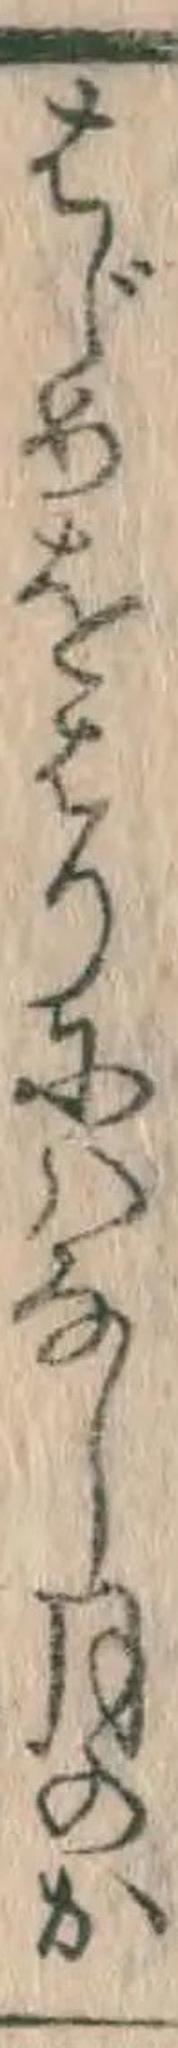はじめをはりにはなし月のか
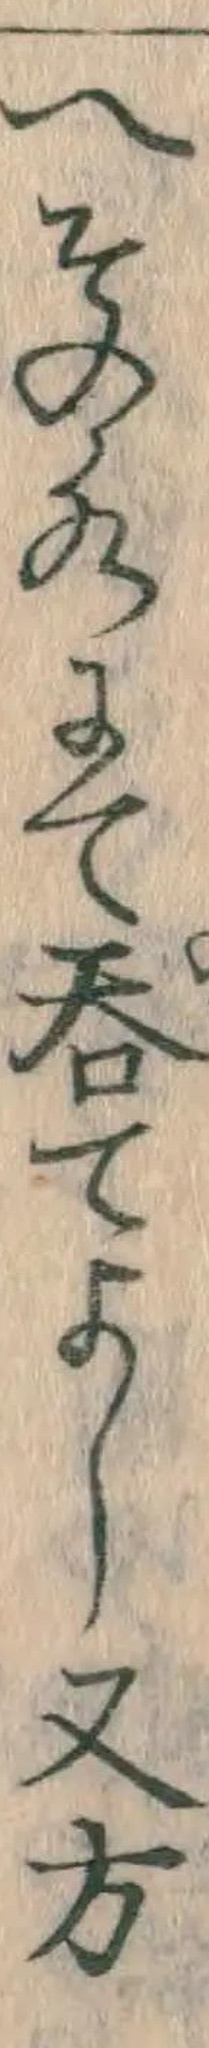へその水にて吞てよし又方
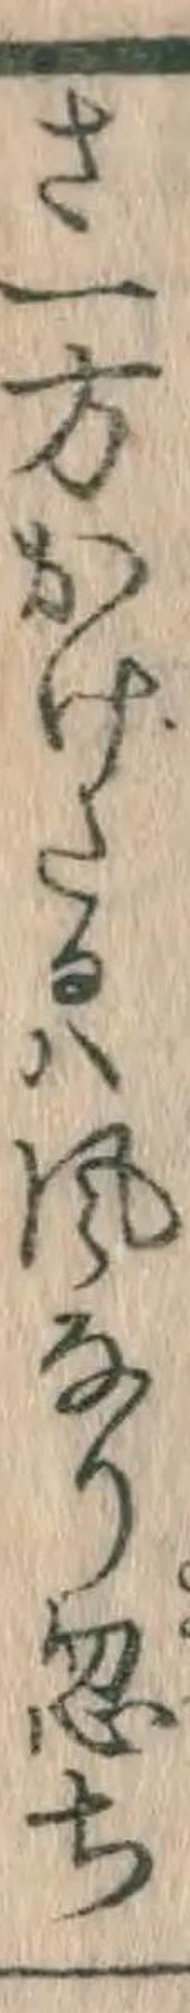さ一方かけたるは風なり忽ち
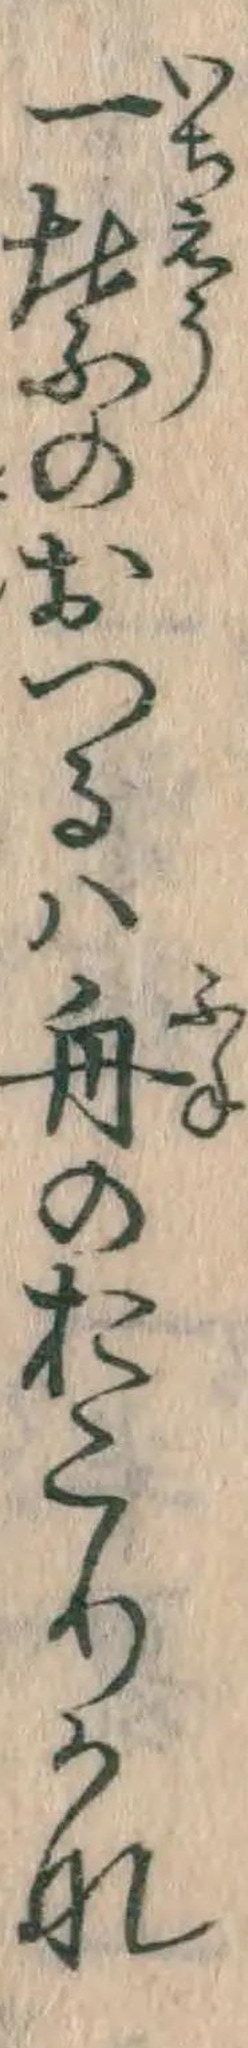一葉のおつるは舟のおこりかな
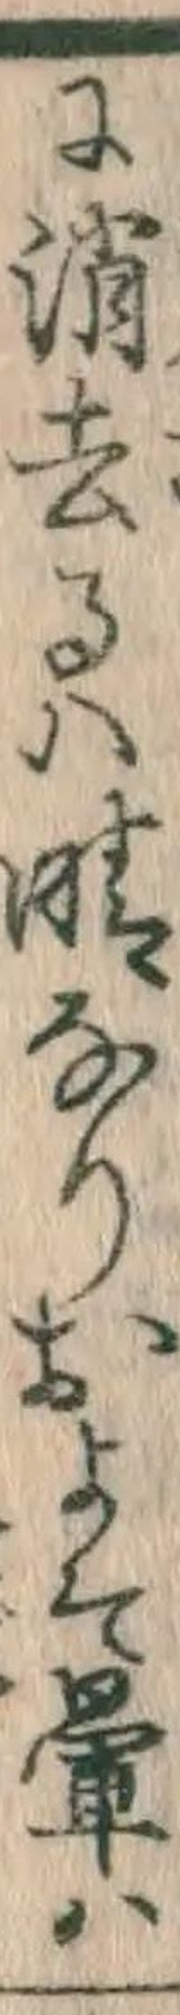に消去るは晴なりおよそ暈は
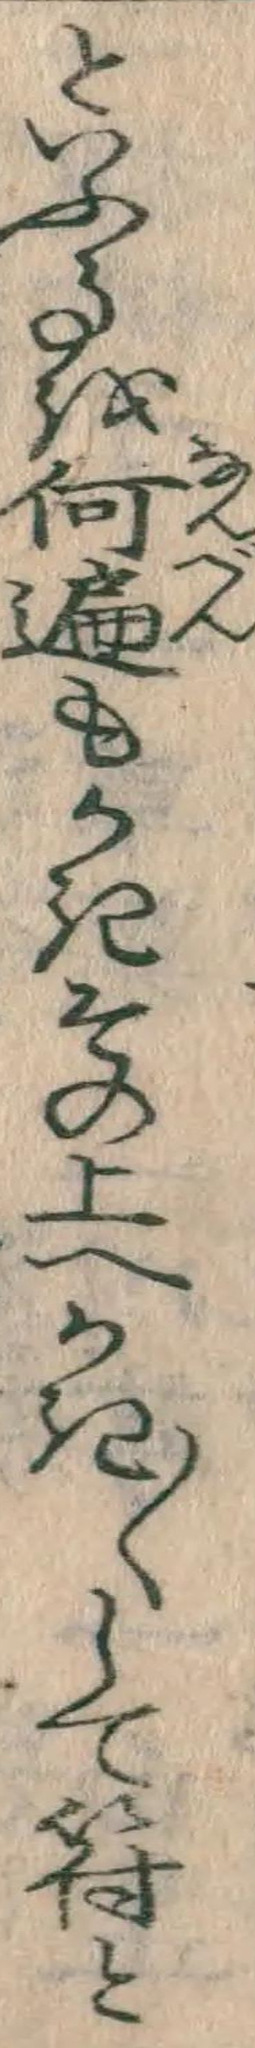といふ事を何遍もかきその上へかき〳〵して符と
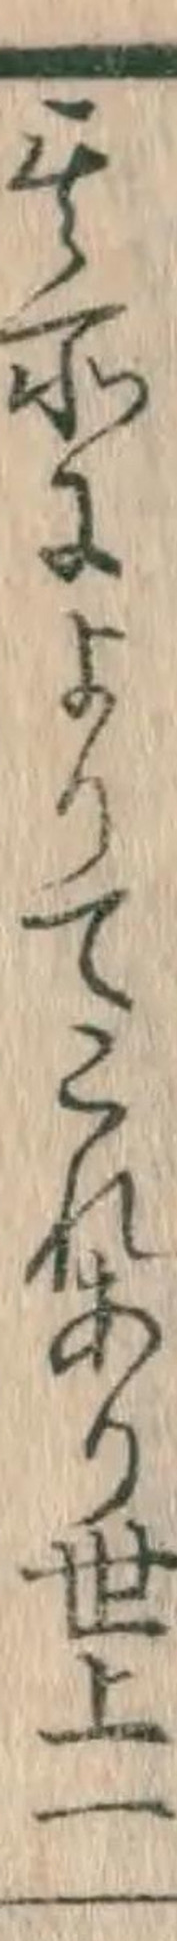其所によりてこれあり世上一
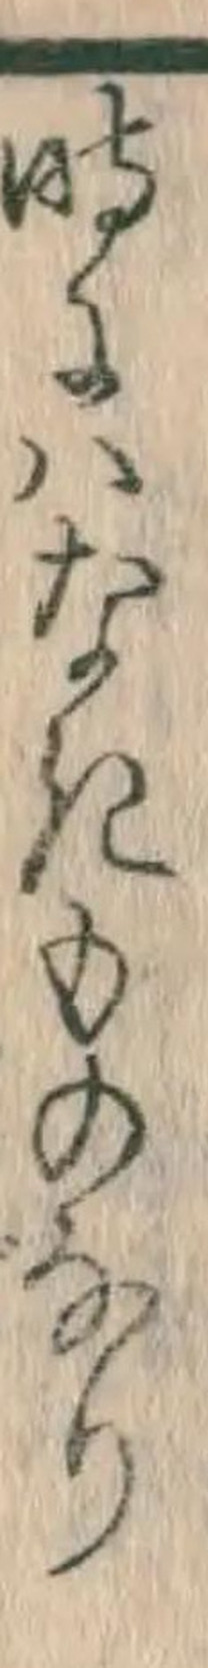時にはなきものなり
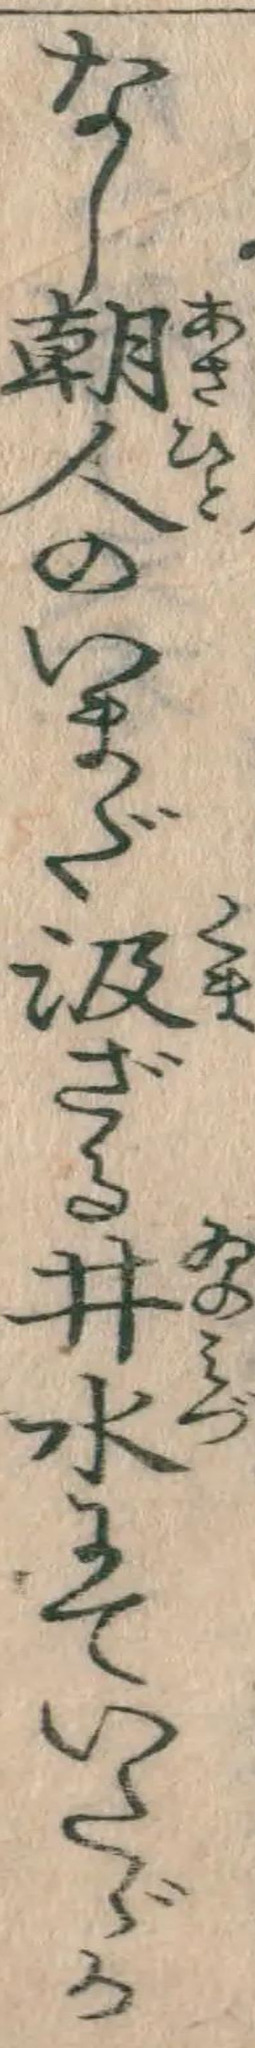なし朝人のいまだ汲ざる井水にていたゞか
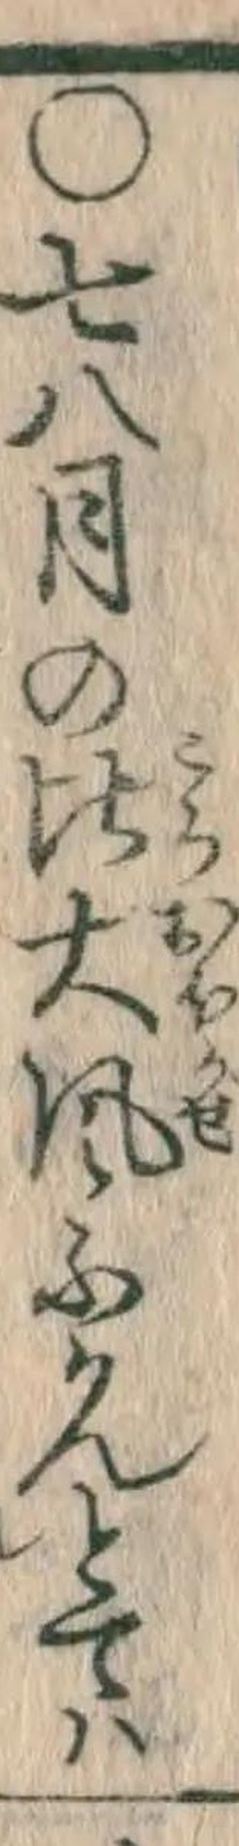○七八月の比大風ふかんとては
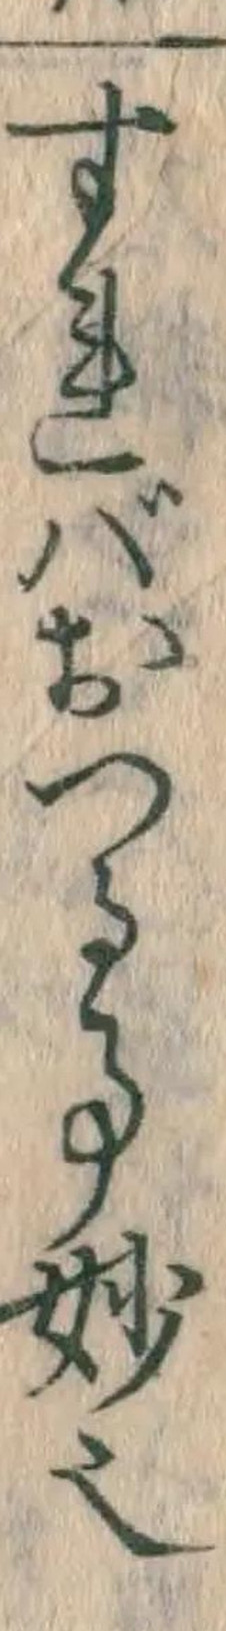すればおつる事妙也
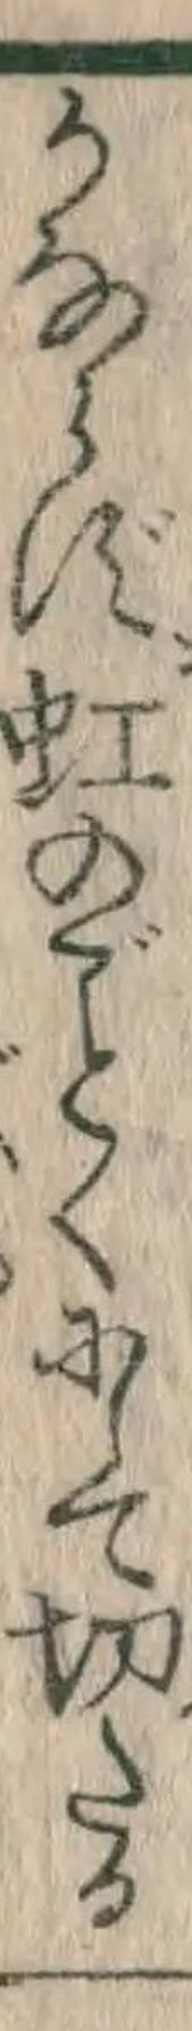かならず虹のごとくにして切たる
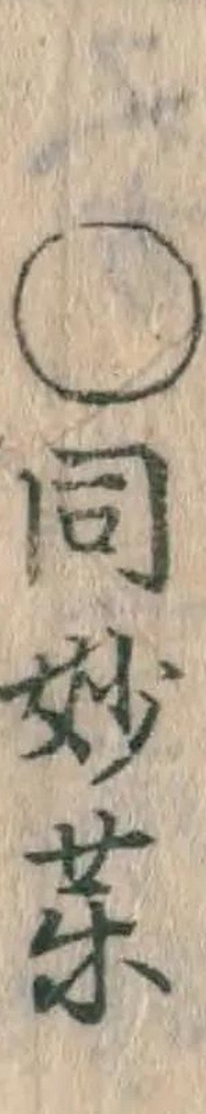○同妙薬
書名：広益秘事大全 3巻. [3]
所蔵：国立国会図書館 National Diet Library, JAPAN
